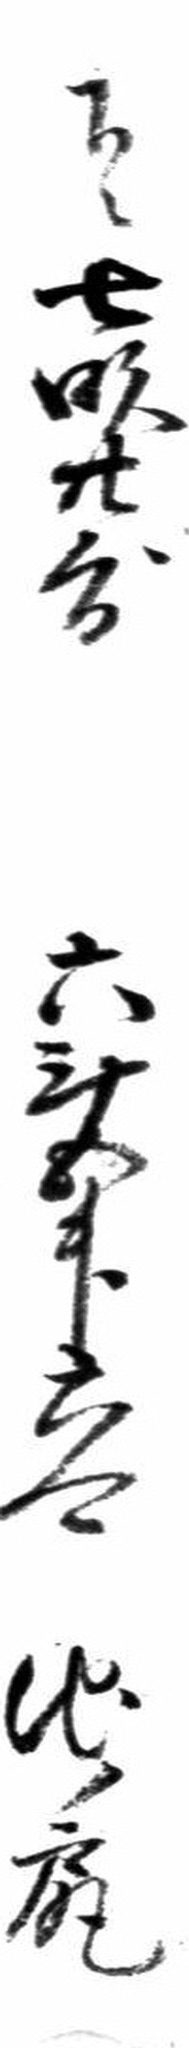下々七畝廿歩六斗五升六合池ノ尻
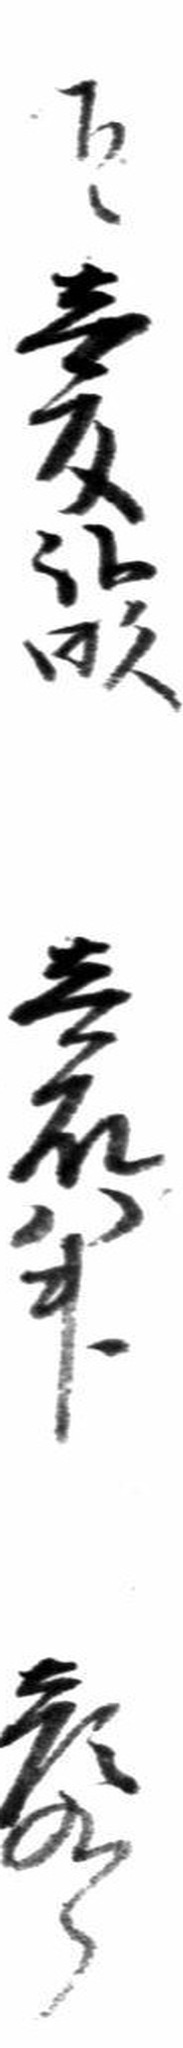下々壱反弐畝壱石八升彦九郎
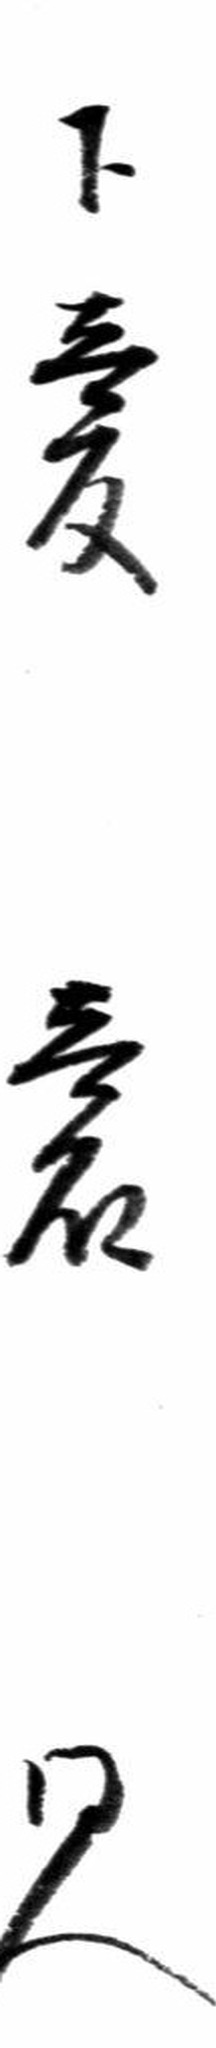下壱反壱石同人
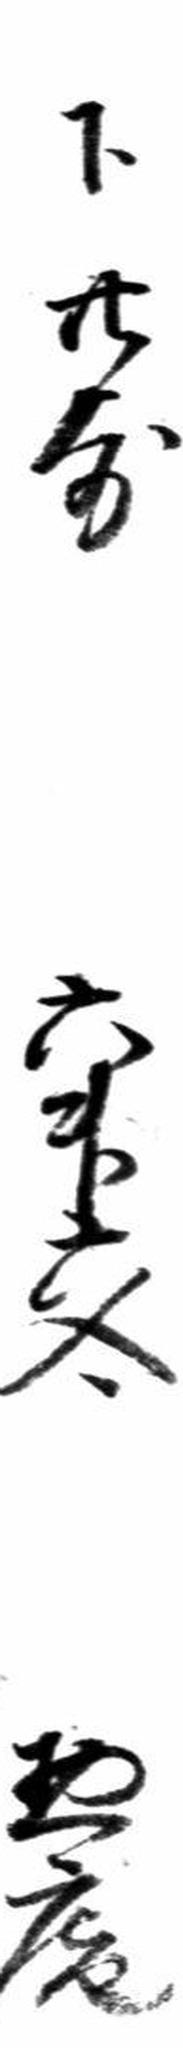下廿歩六升六合惣庵
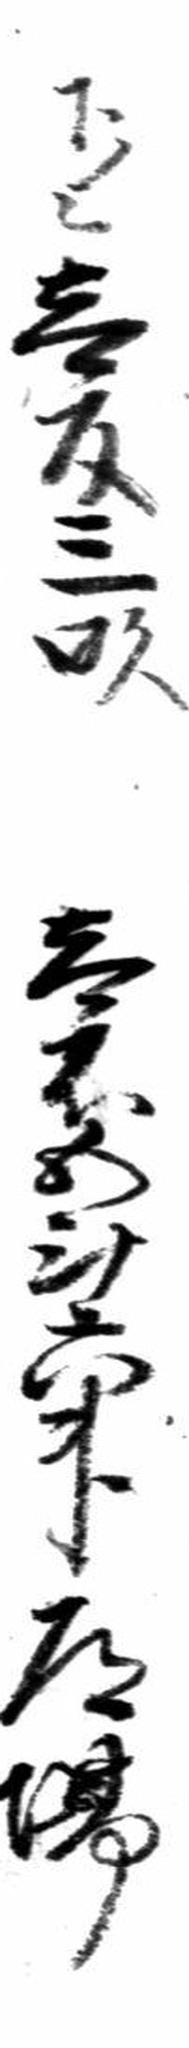下ノ上壱反三畝壱石五斗六升道場
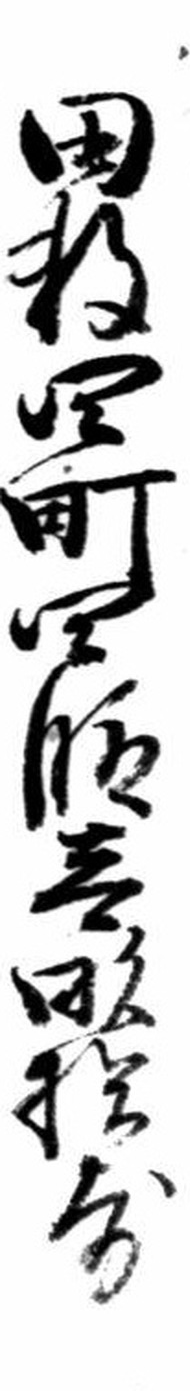田数四町四段壱畝拾歩
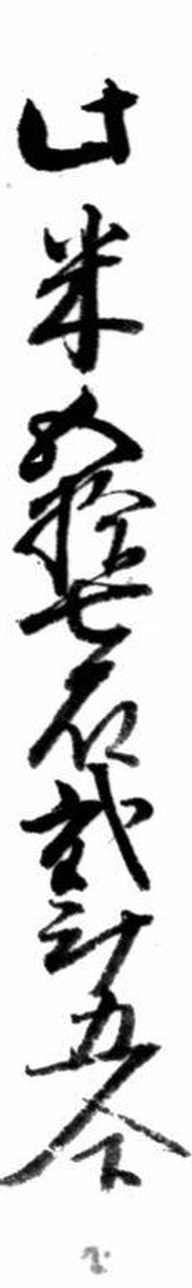此米五拾七石弐斗五合
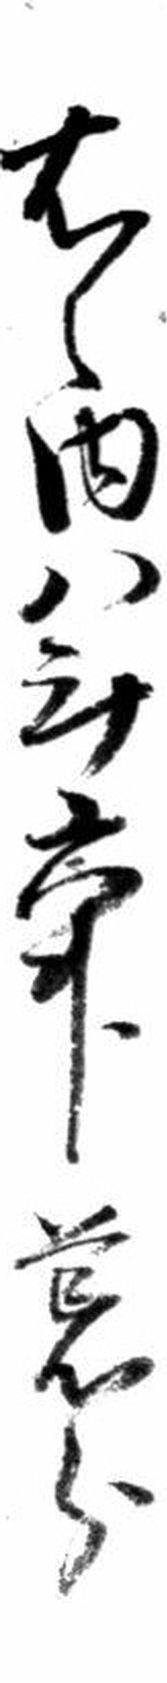右之内八斗六升荒分

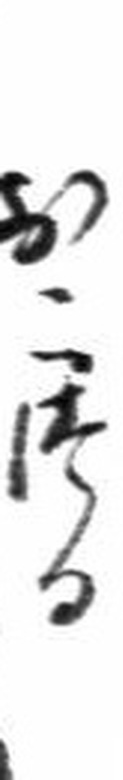おこつる
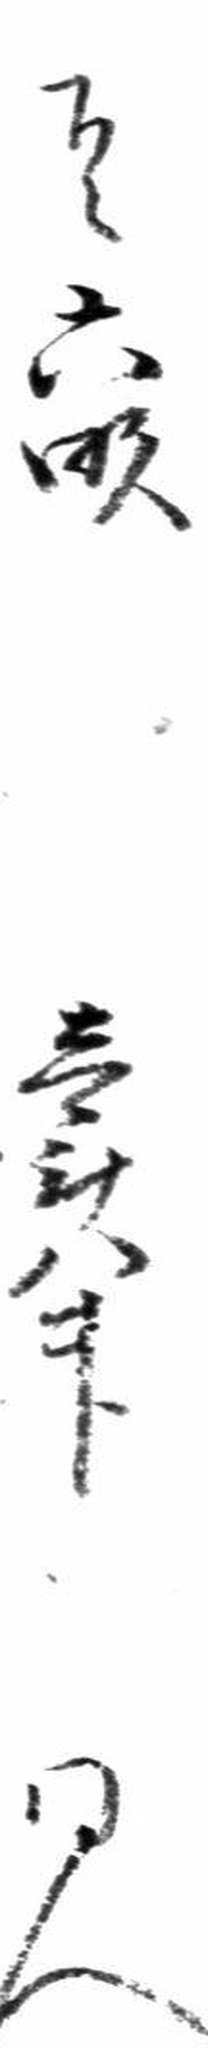下々六畝壱斗八升同人
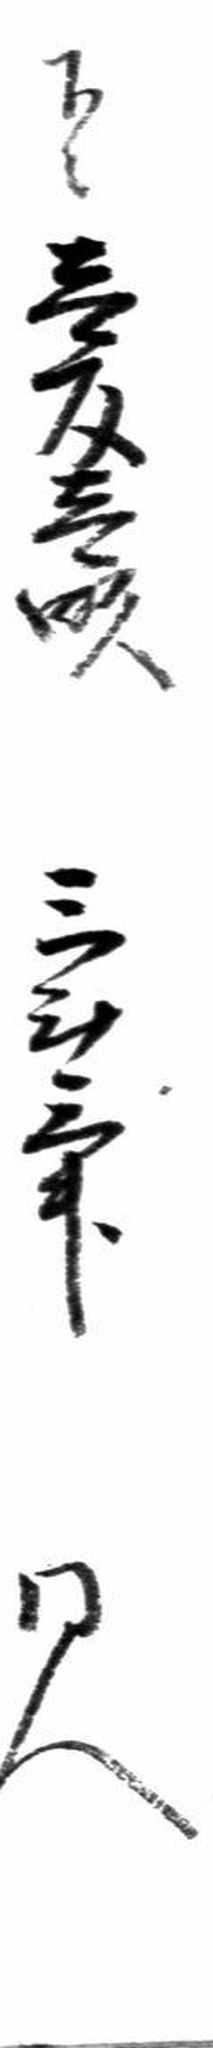下々壱反壱畝三斗三升同人
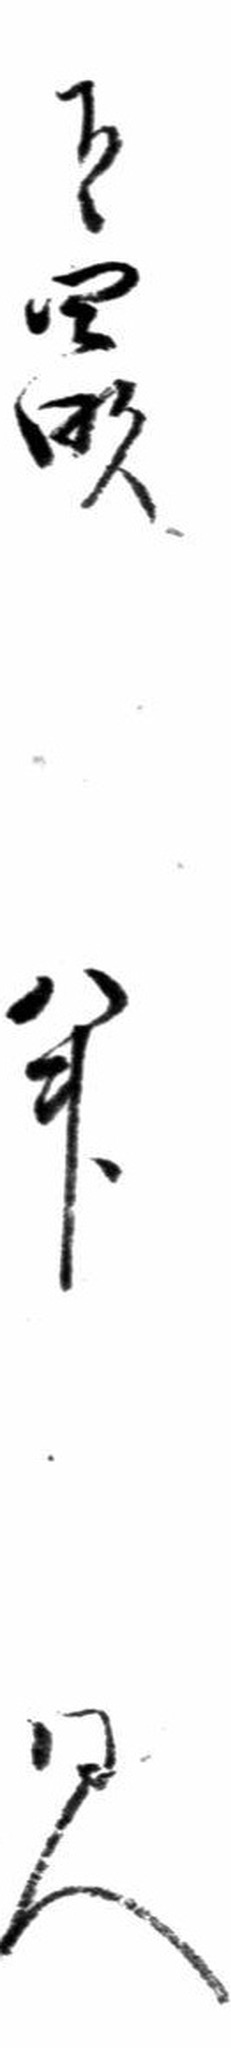下々四畝八升同人
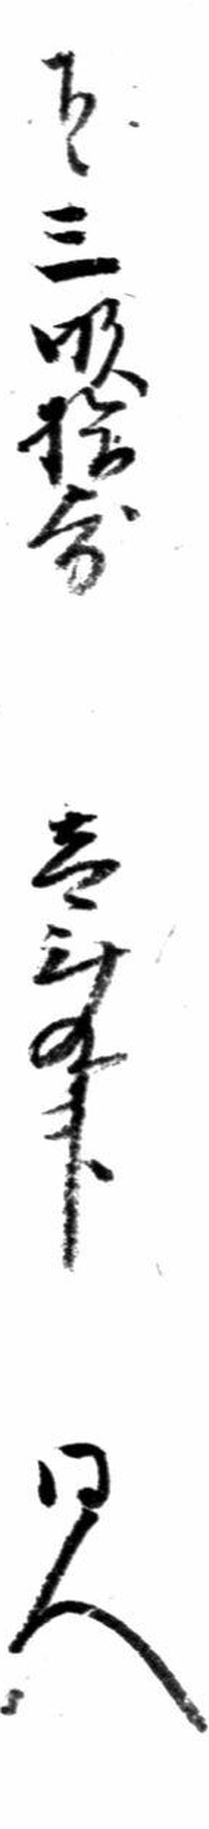下々三畝拾歩壱斗九升同人
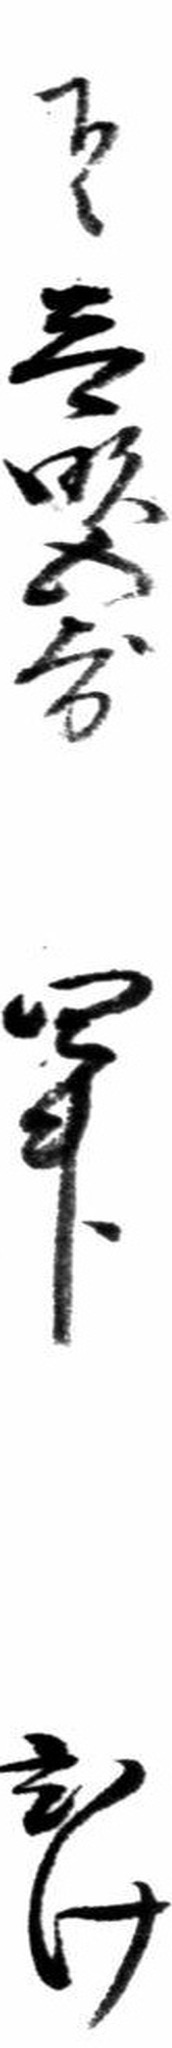下々壱畝五歩四升ひけ
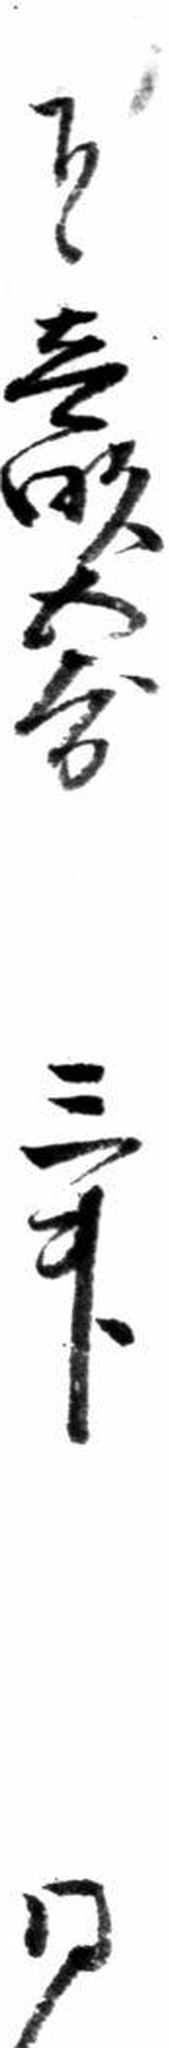下々壱畝五歩三升同人
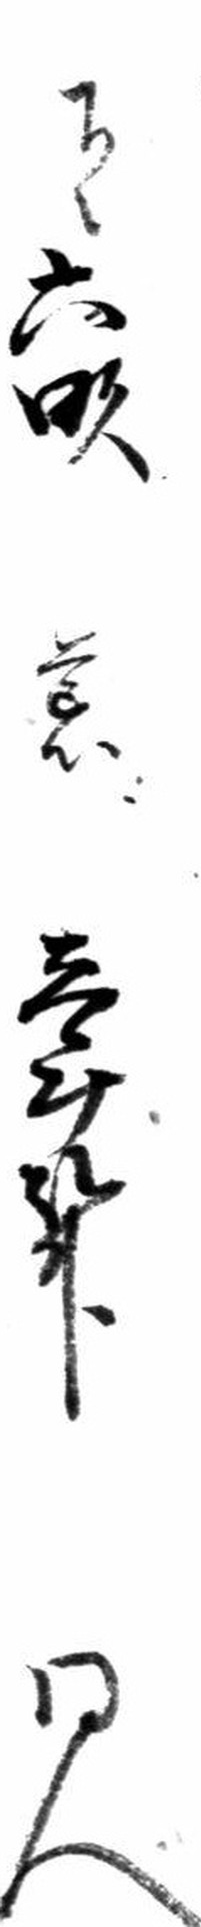下々六畝荒壱斗弐升同人
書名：若州三方郡之内世久見浦御検地帳（世久見浦検地帳写）
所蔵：福井県文書館 Fukui Prefectural Archives
